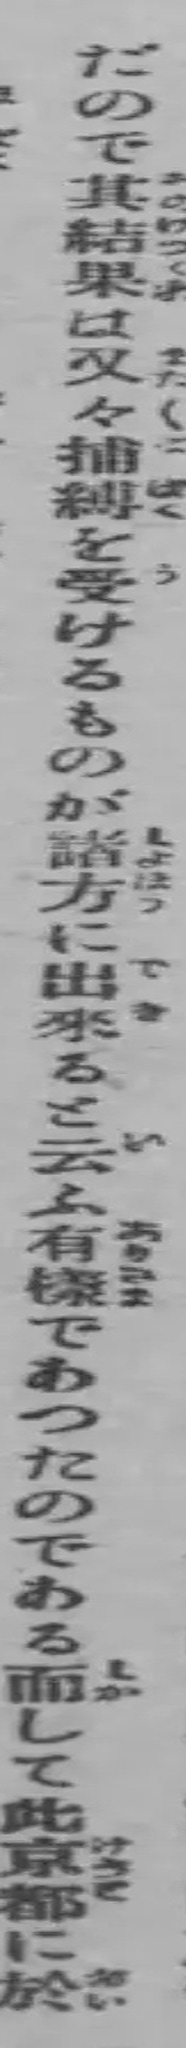だので其結果は又々捕縛を受けるものが諸方に出来ると云ふ有様であつたのである而して此京都に於
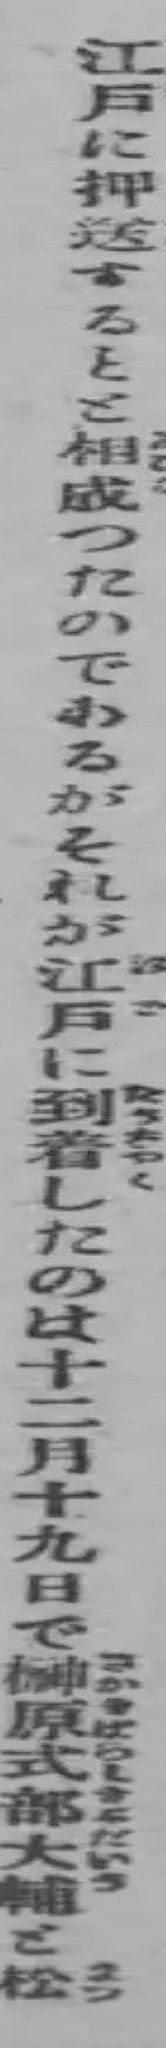江戸に押送することと相成つたのであるがそれが江戸に到着したのは十二月十九日で榊原式部大輔と松
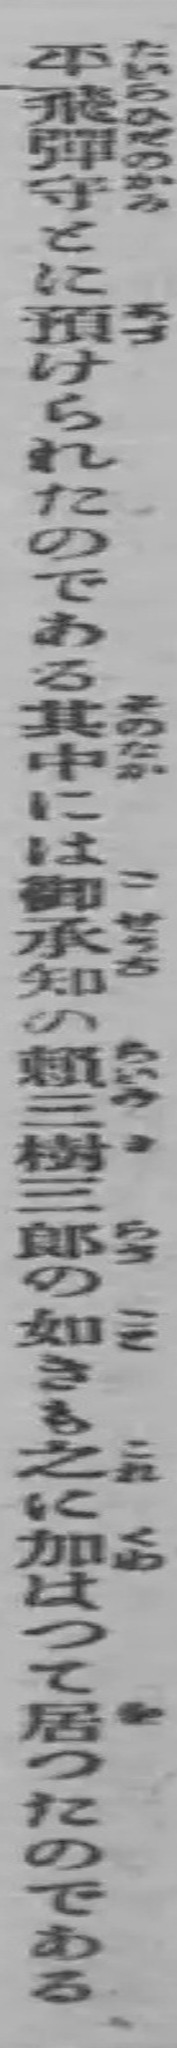平飛騨守とに預けられたのである其中にが御承知の頼三樹三郎の如きも之に加はつて居つたのである
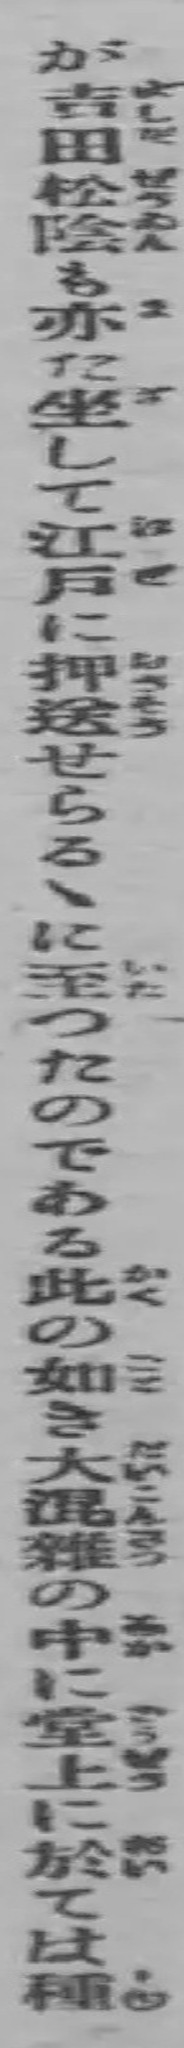が吉田松陰も亦た坐して江戸に押送せらるゝに至つたのである此の如き大混雑の中に堂上に於ては種
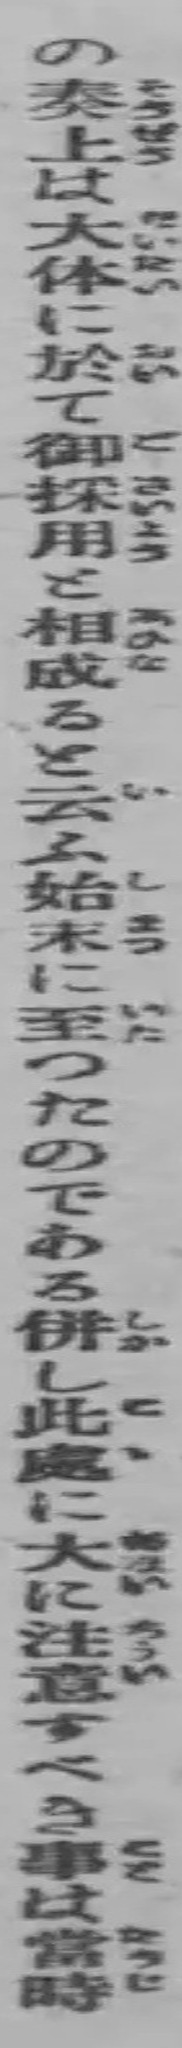の奏上は大体に於て御採用と相成ると云ふ始末に至つたのである併し此処に大に注意すべき事は当時
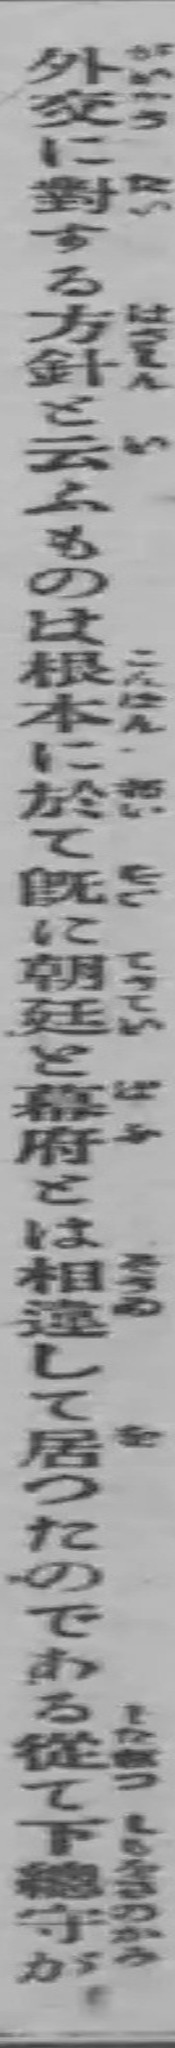外交に対する方針と云ふものは根本に於て既に朝廷と幕府とは相違して居つたのである従て下総守が
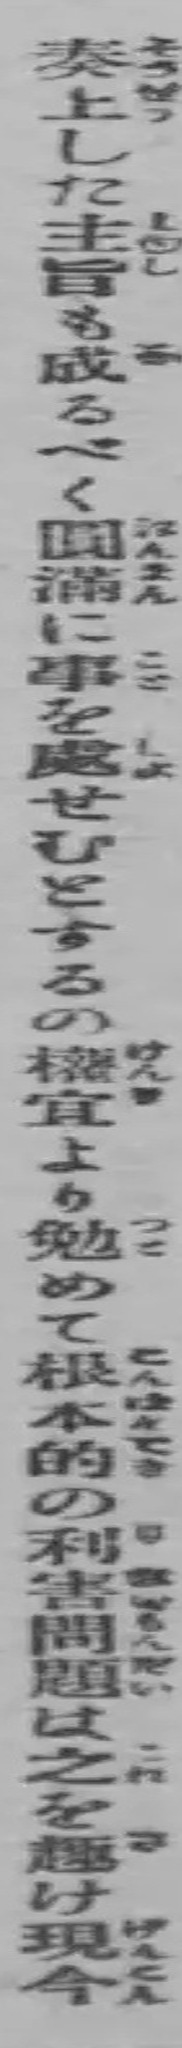奏上した主旨も成るべく円満に事を処せむとするの権宜より勉めて根本的の利害問題は之を趣け現今
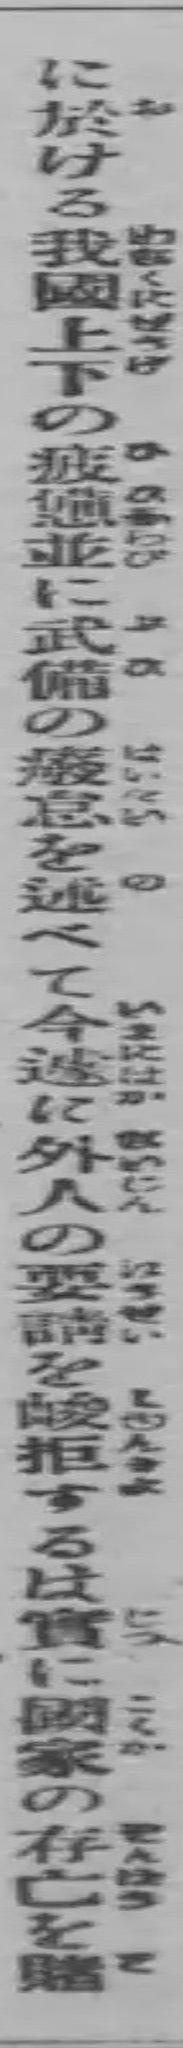に於ける我国上下の疲憊並に武備の廃怠を述べて今遽に外人の要請を峻拒するは実に国家の存亡を賭
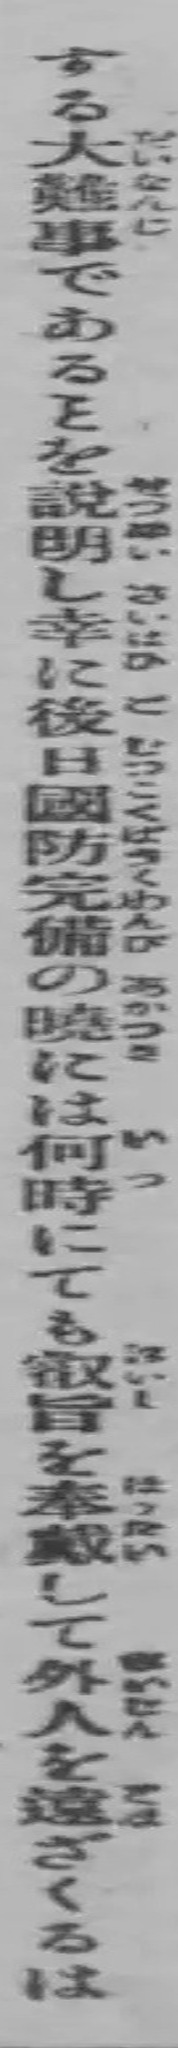する大難事であることを説明し幸に後日国防完備の暁には何時にても叡旨を奉戴して外人を遠ざくるは
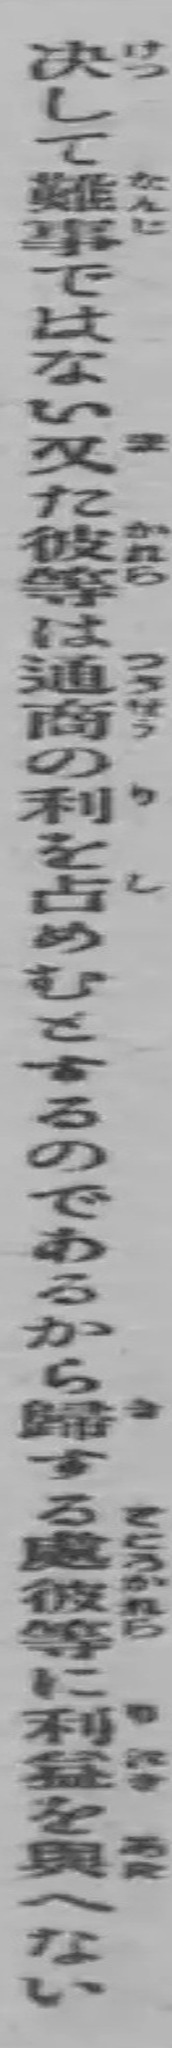決して難事ではない又た彼等は通商の利を占めむとするのであるから帰する処彼等に利益を与へない
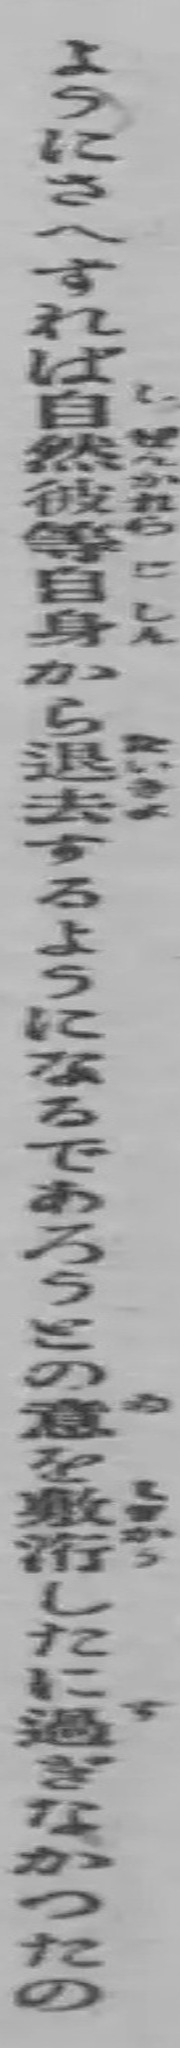ようにさへすれば自然彼等自身から退去するようになるであろうとの意を敷衍したに過ぎなかつたの
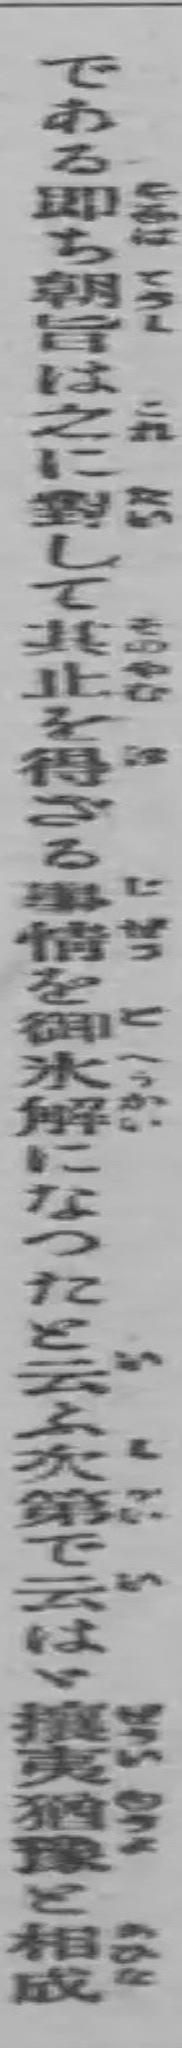である即ち朝旨は之に対して其止を得ざる事情を御氷解になつたと云ふ次第で云はゞ攘夷猶予と相成
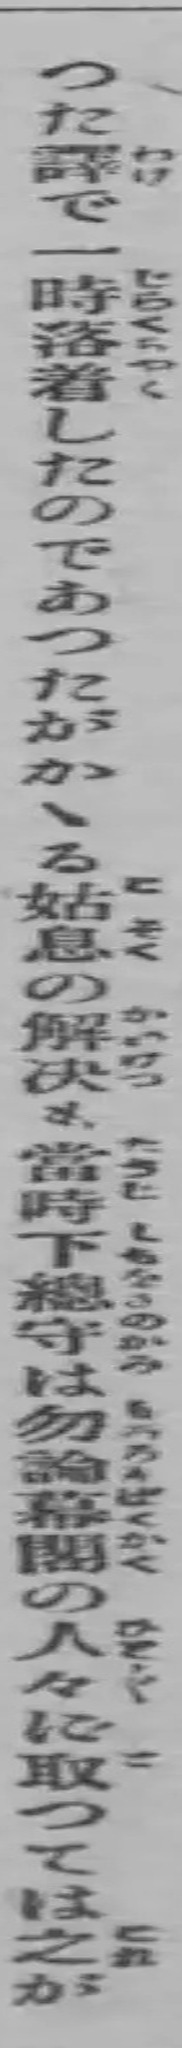つた訳で一時落着したのであつたがかゝる姑息の解決も当時下総守は勿論幕閣の人々に取つては之が
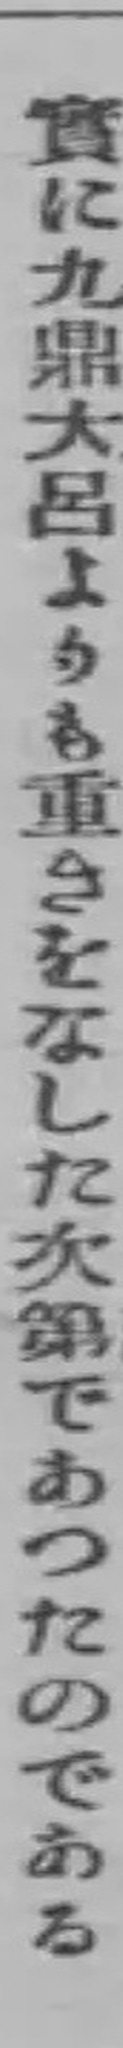実に九鼎大呂よりも重きをなした次第であつたのである
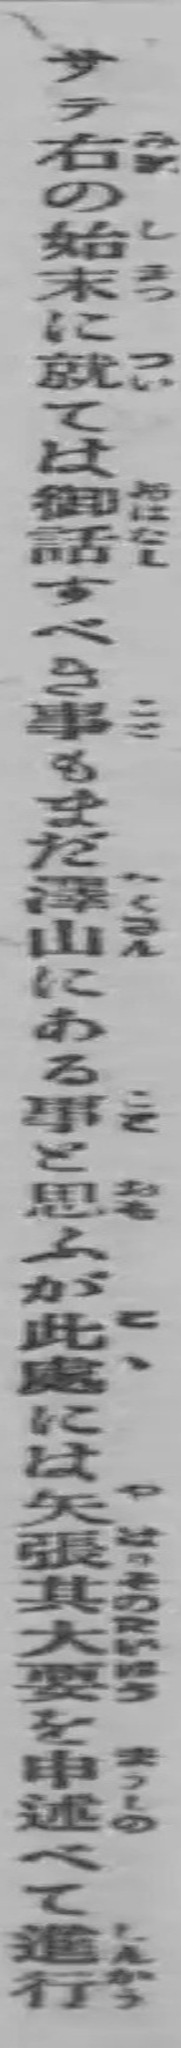サテ右の始末に就ては御話すべき事もまだ沢山にある事と思ふが此処には矢張其大要を申述べて進行
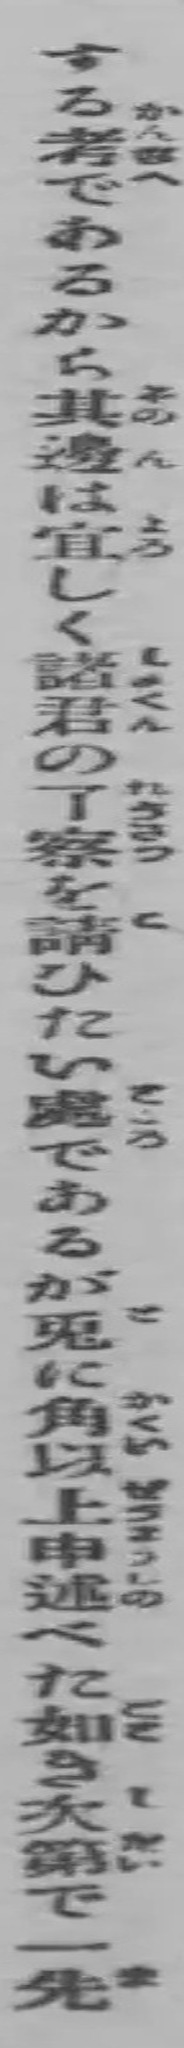する考であるから其辺は宜しく諸君の了察を請ひたい処であるが兎に角以上申述べた如き次第で一先
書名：豊橋市史談
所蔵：国立国会図書館 National Diet Library, JAPAN
